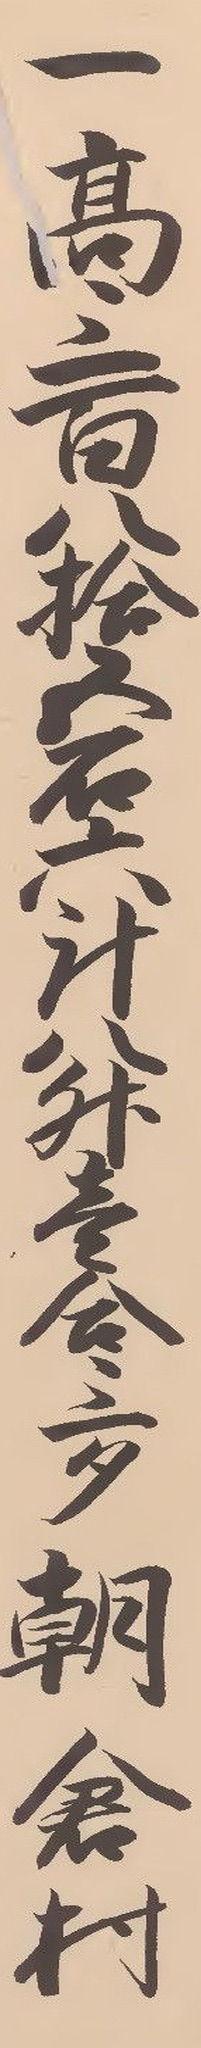一高三百八拾五石六斗八升壱合三勺朝倉村
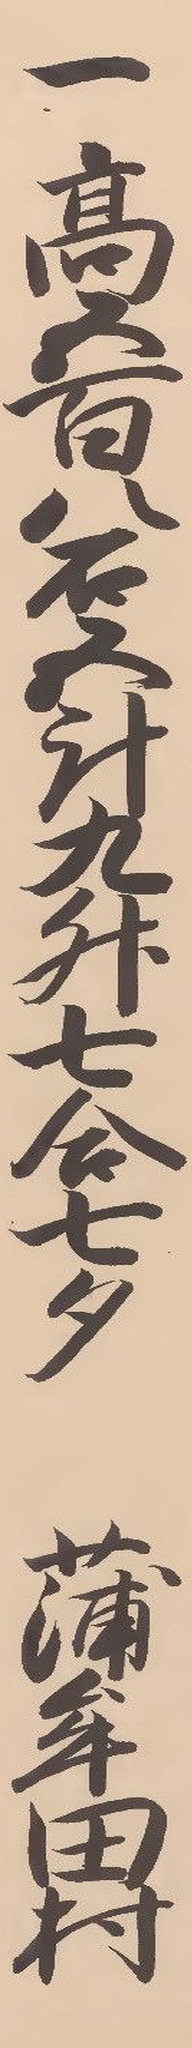一高五百八石五斗九升七合七勺蒲牟田村

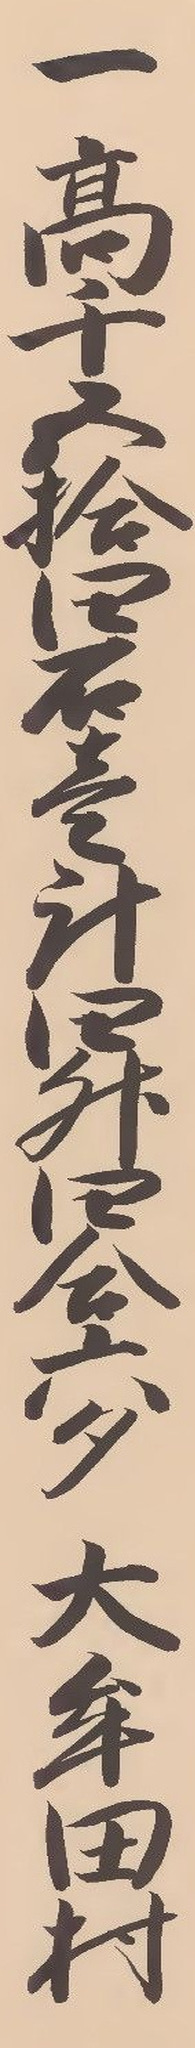一高千五拾四石壱斗四升四合六勺大牟田村
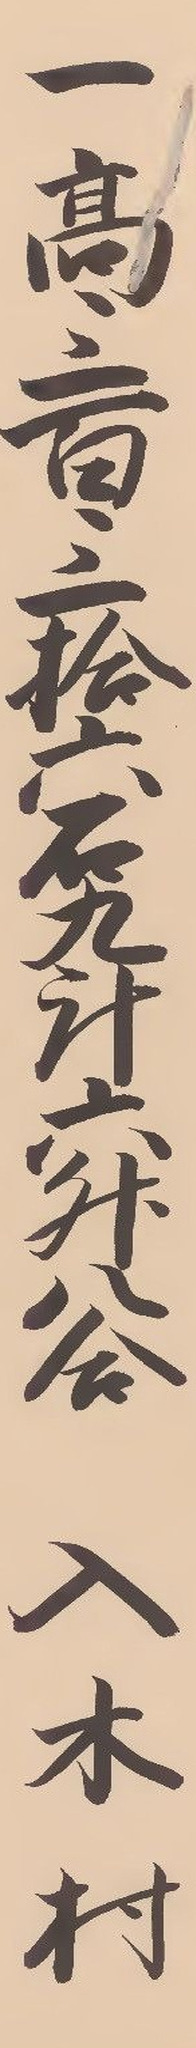一高三百三拾六石九斗六升八合入木村
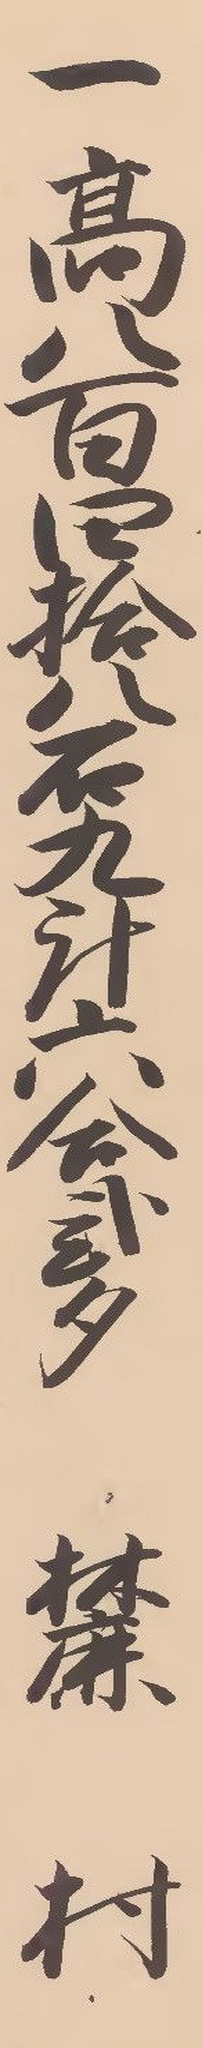一高八百四拾八石九斗六合弐勺麓村
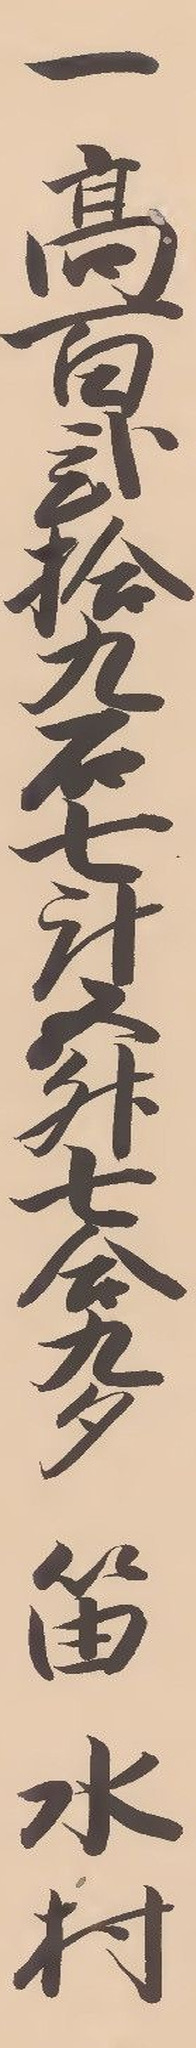一高百弐拾九石七斗五升七合九勺笛水村
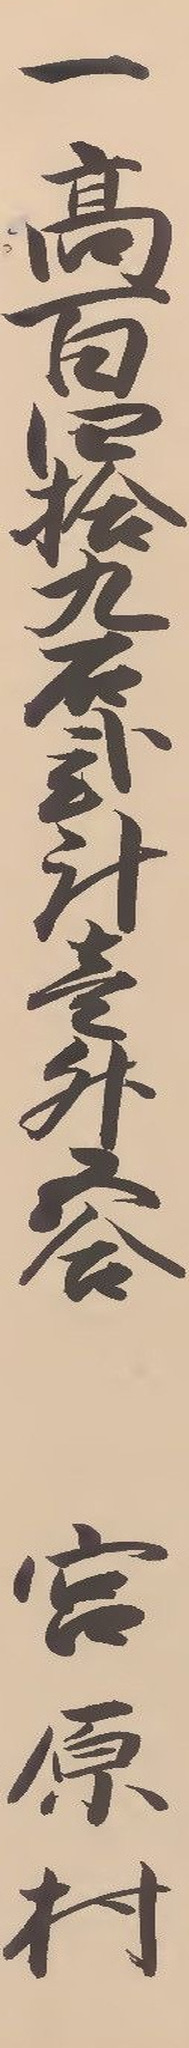一高百四拾九石弐斗壱升五合宮原村
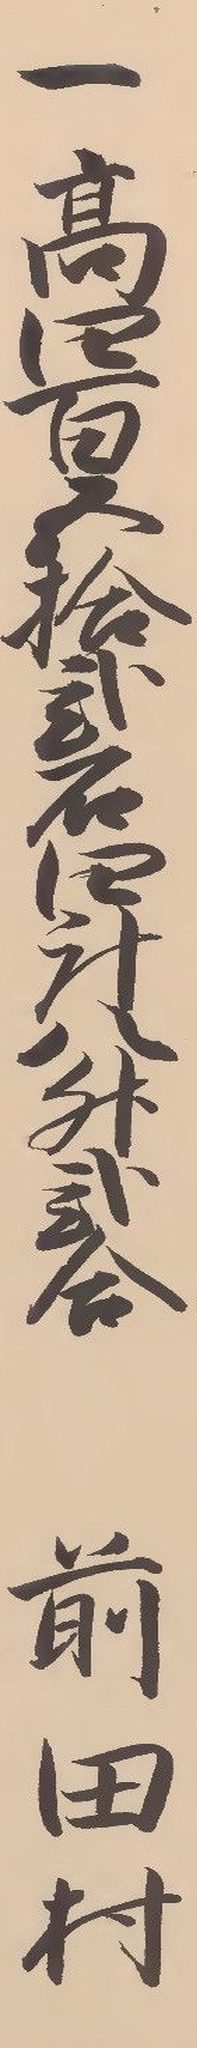一高四百五拾弐石四斗八升弐合前田村
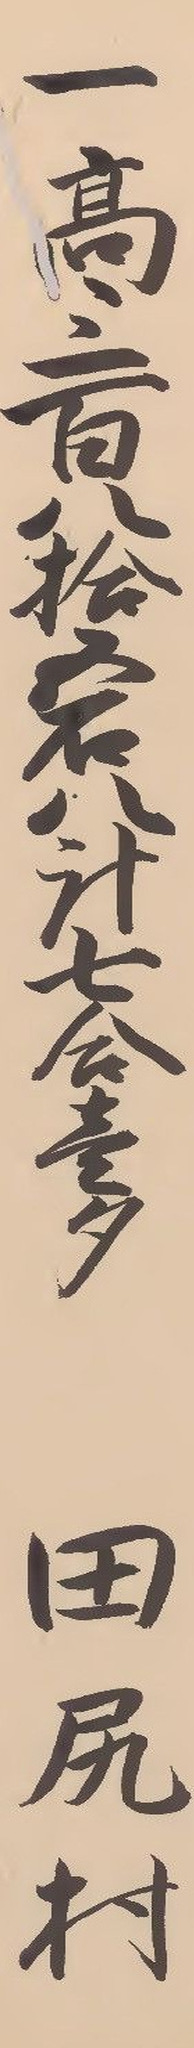一高三百八拾五石八斗七合壱勺田尻村
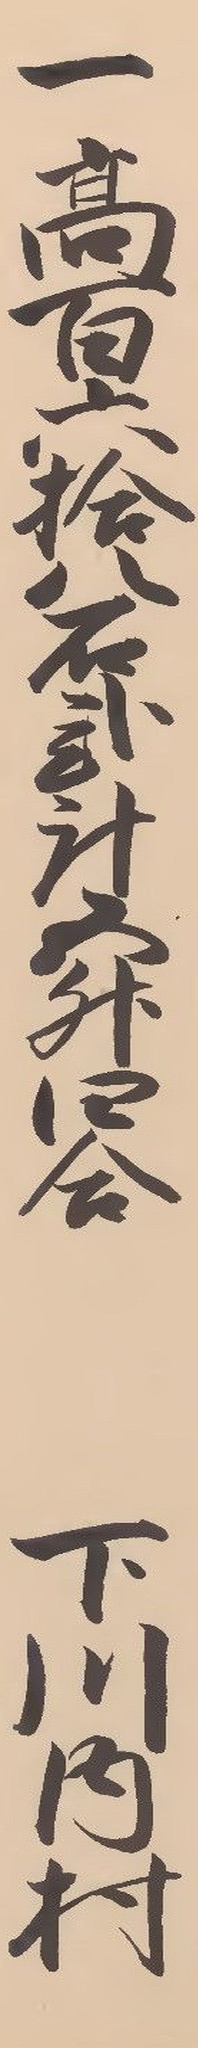一高百六拾八石弐斗五升四合下川内村

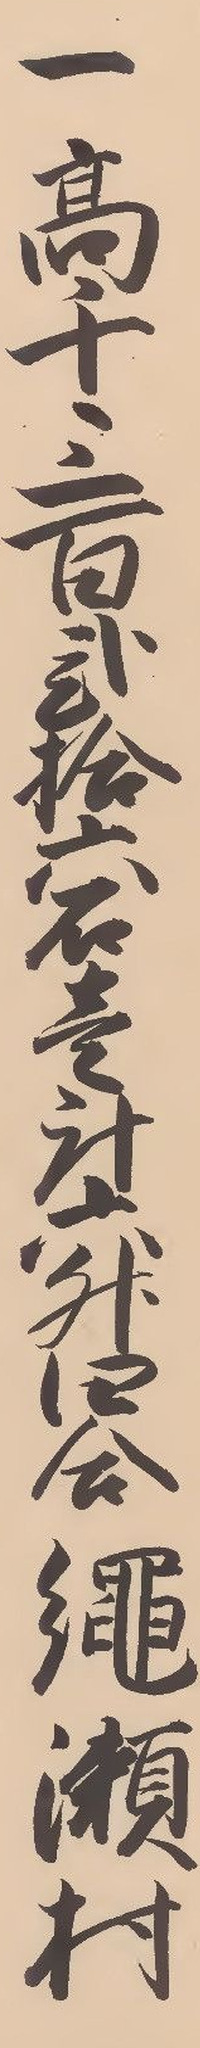一高千三百弐拾六石壱斗六升四合縄瀬村
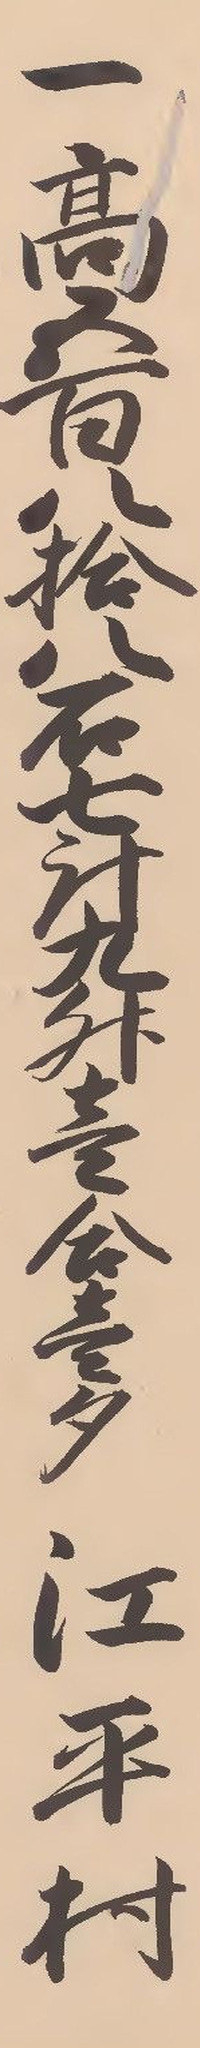一高五百八拾八石七斗九升壱合壱勺江平村
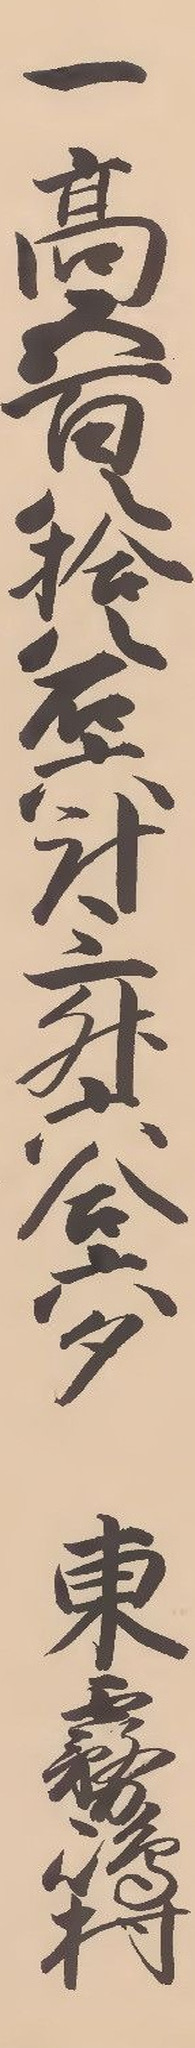一高五百八拾八石六斗三升六合六勺東霧島村
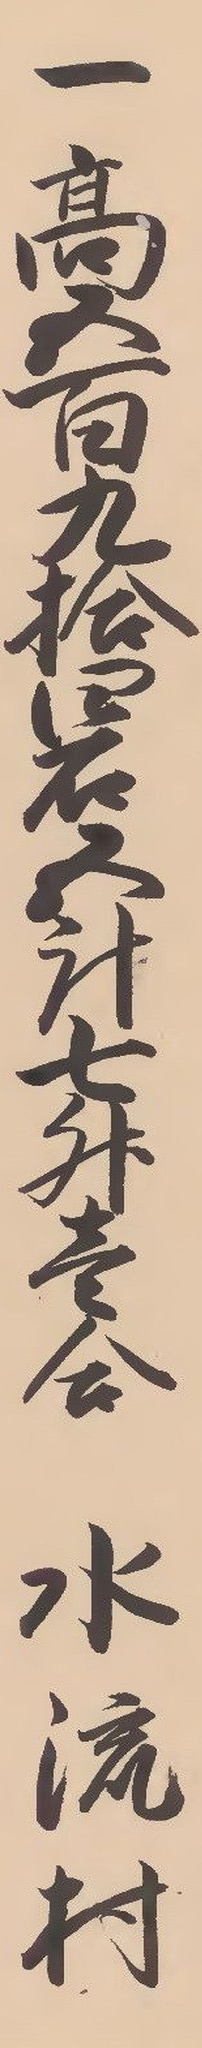一高五百九拾四石五斗七升壱合水流村
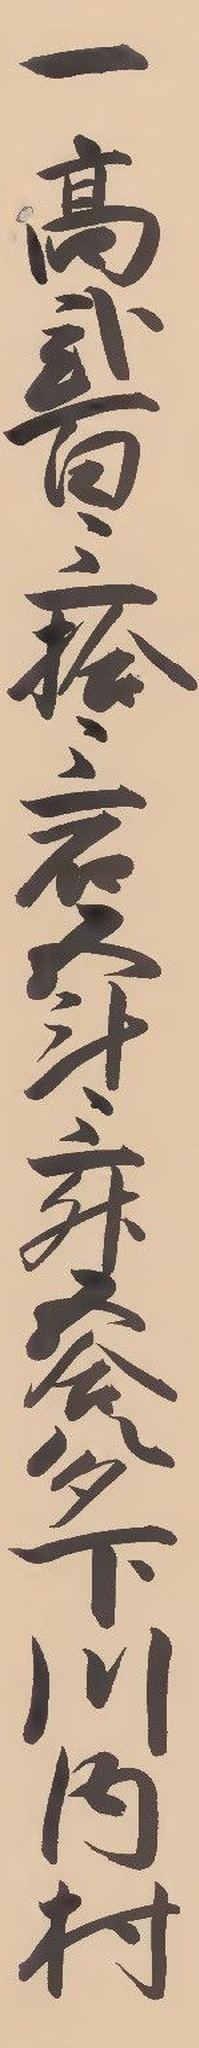一高弐百三拾三石五斗三升五合八勺下川内村
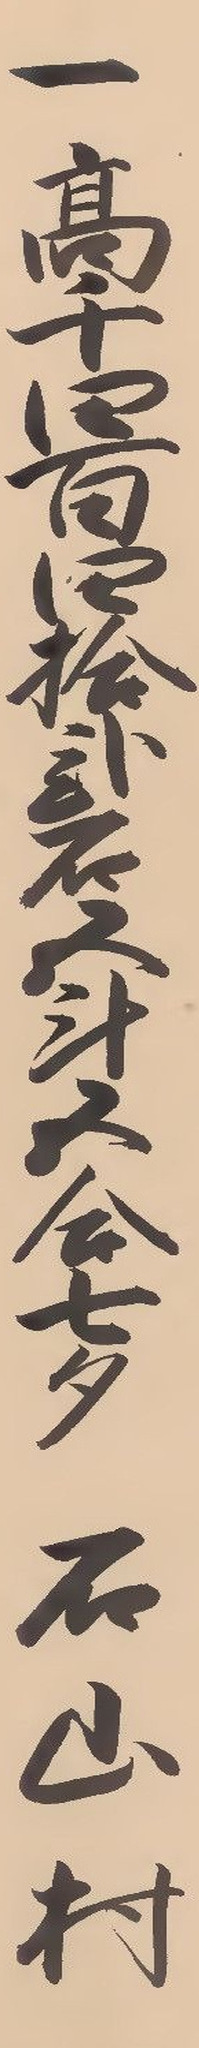一高千四百四拾弐石五斗五合七勺石山村
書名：日向国郷帳
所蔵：国立公文書館 National Archives of Japan
